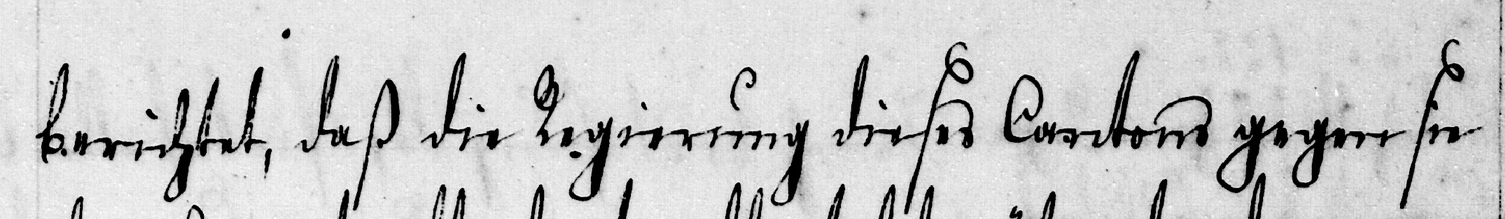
berichtet, daß die Regierung dieses Cantons gegen sie
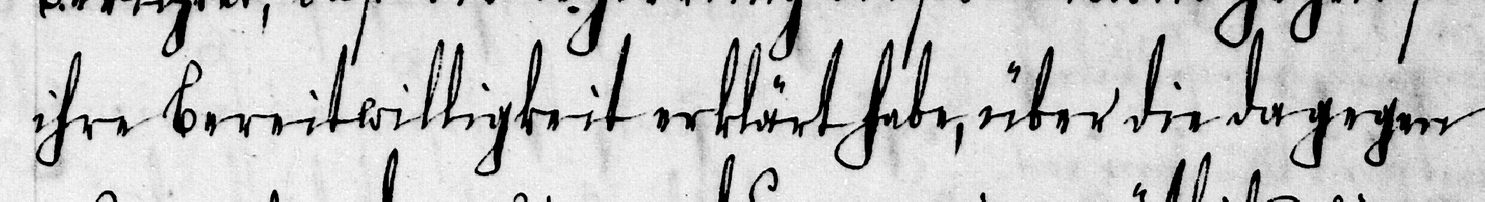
ihre Bereitwilligkeit erklärt habe, über die dagegen
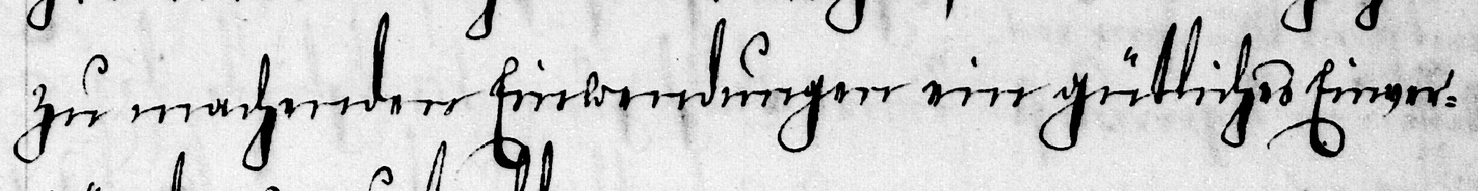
zu machenden Einwendungen ein gütliches Einver¬
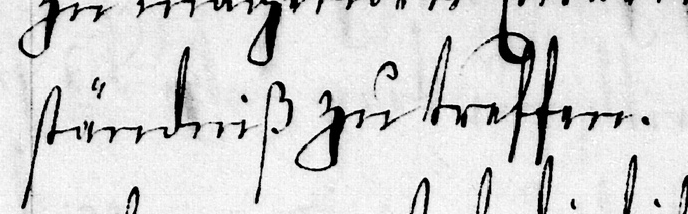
ständniß zu treffen.
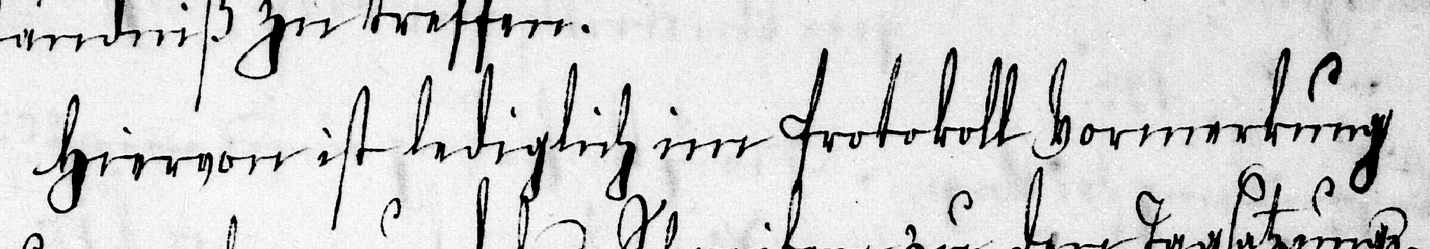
Hiervon ist lediglich im Protokoll Vormerkung
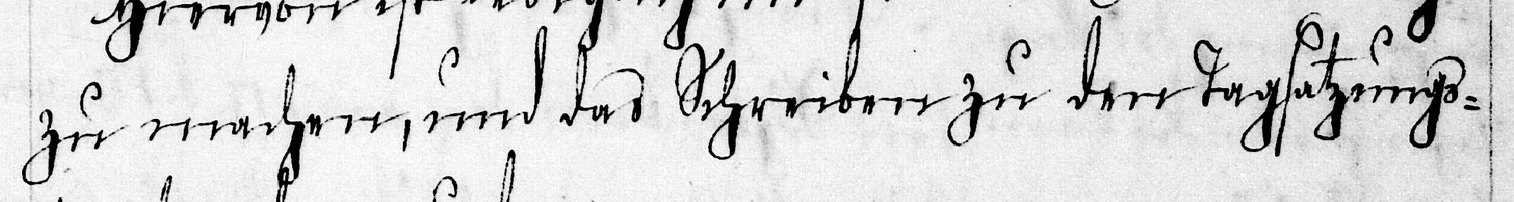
zu machen, und das Schreiben zu den Tagsatzungs¬
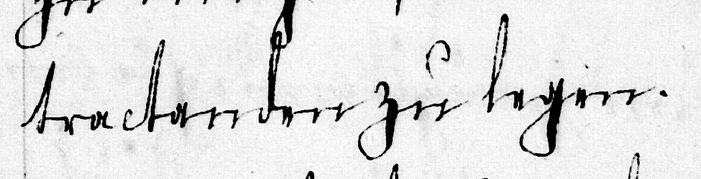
tractanden zu legen.
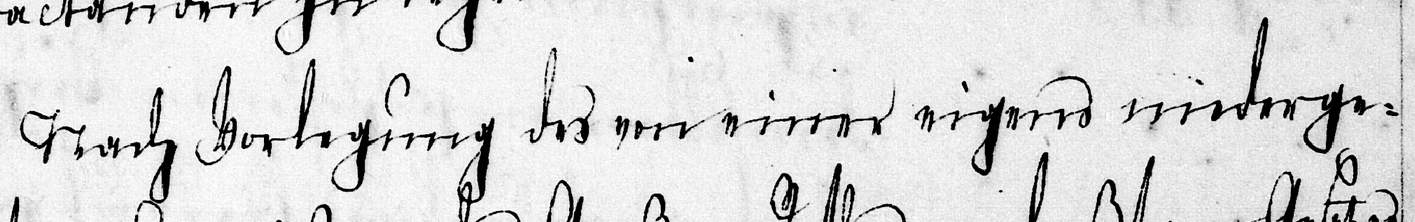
Nach Vorlegung des von einer eigens niederges¬
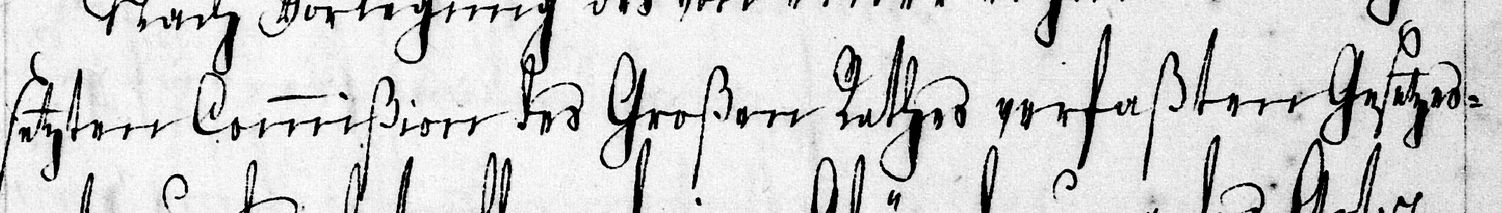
etzten Commißion des Großen Rathes verfaßten Gesetzes¬
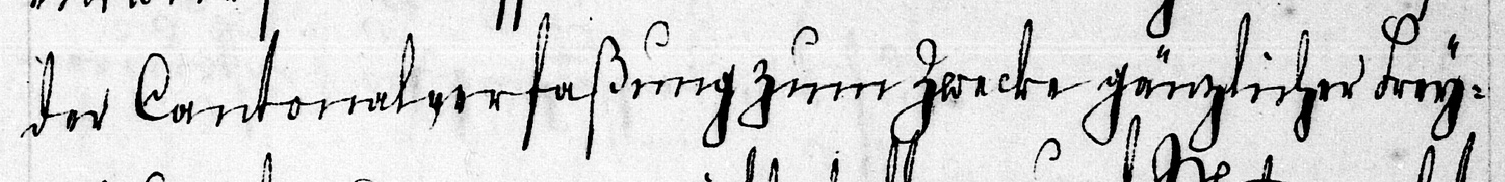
der Cantonalverfaßung zum Zwecke gänzlicher Frey¬
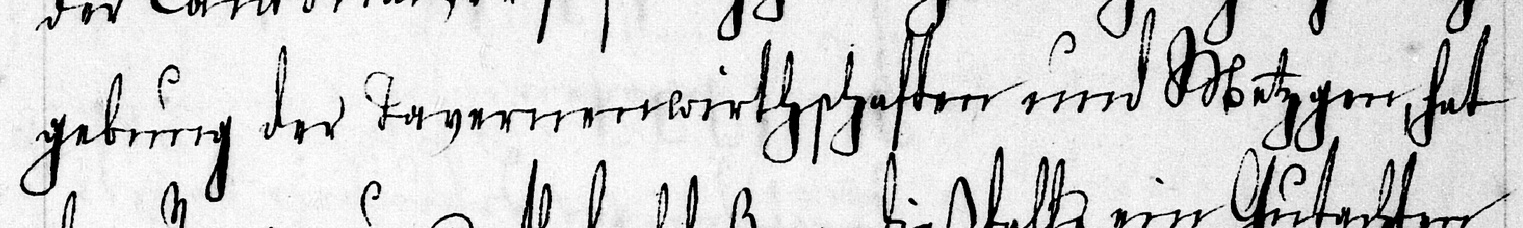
gebung der Tavernenwirthschaften und Metzgen, hat
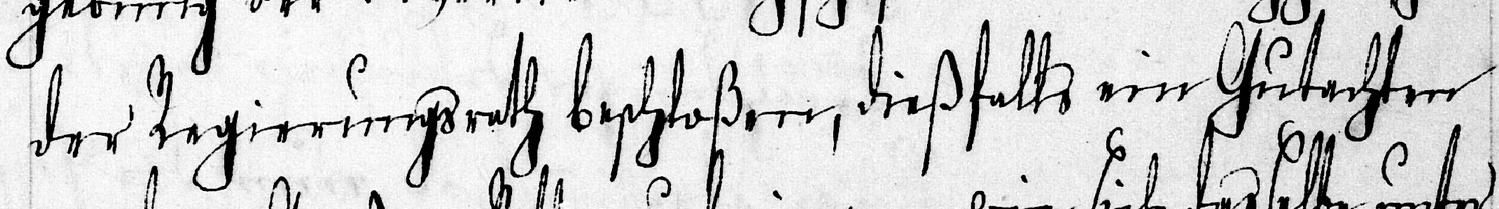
der Regierungsrath beschloßen, dießfalls ein Gutachten
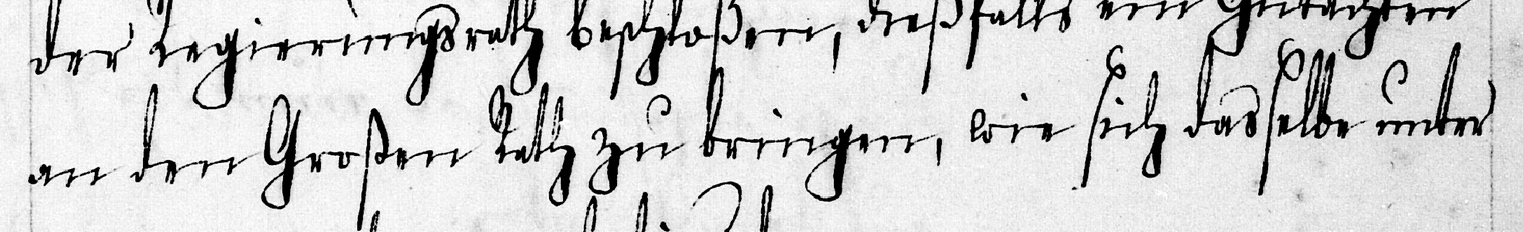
an den Großen Rath zu bringen, wie sich dasselbe unter
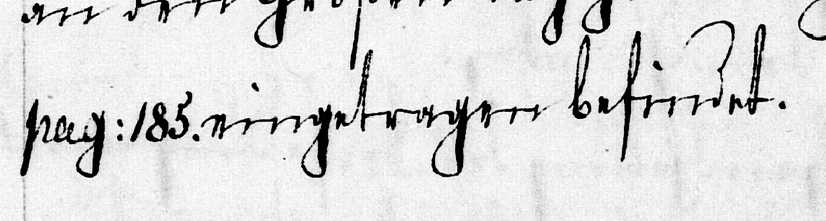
pag: 185. eingetragen befindet.
